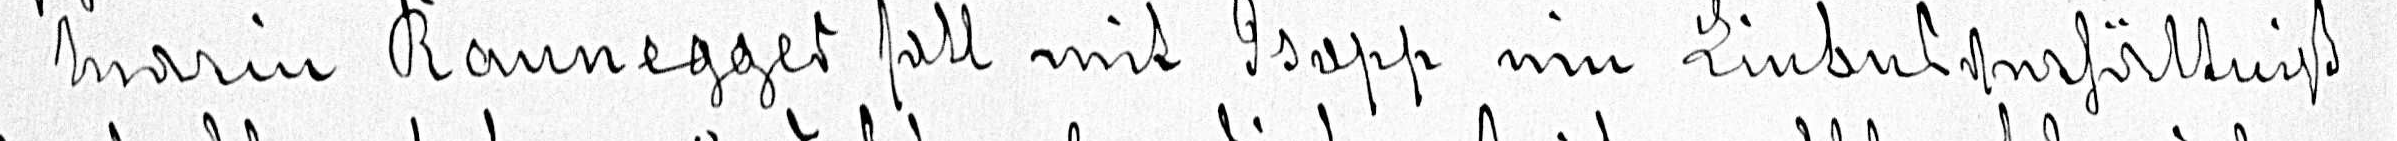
Marie Raunegger soll mit Isopp ein Liebesverhältniß
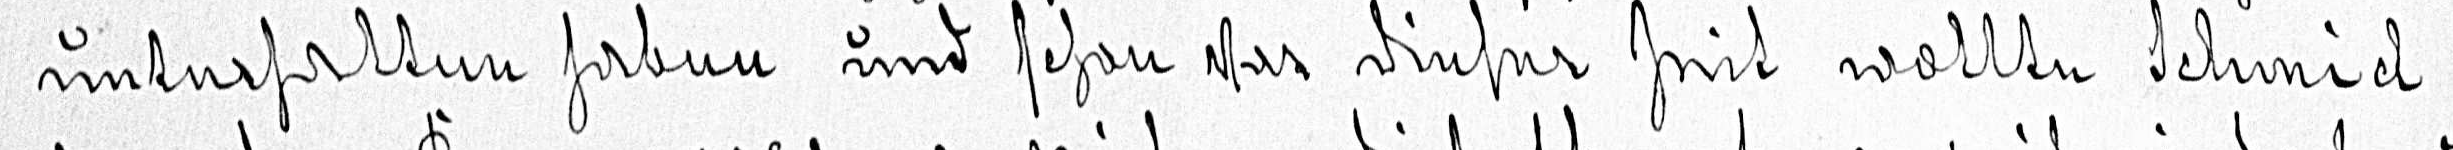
unterhalten haben und schon vor dieser Zeit wollte Schmid
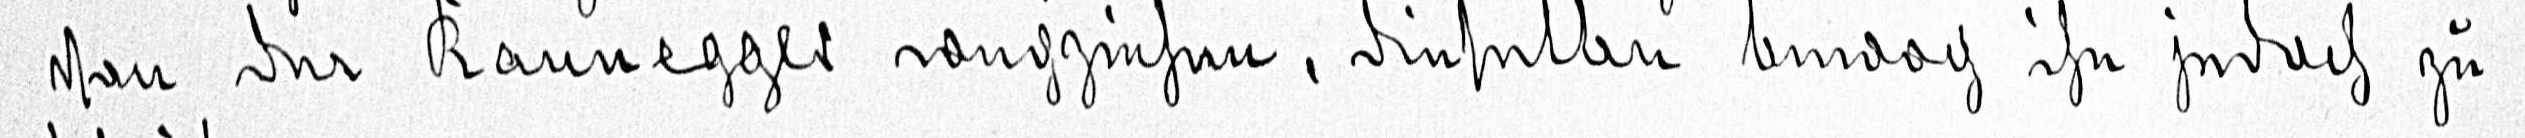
von der Raunegger wegziehen, dieselbe bewog ihn jedoch zu
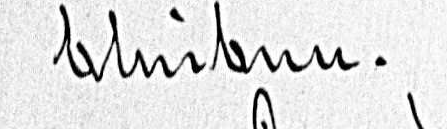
bleiben.
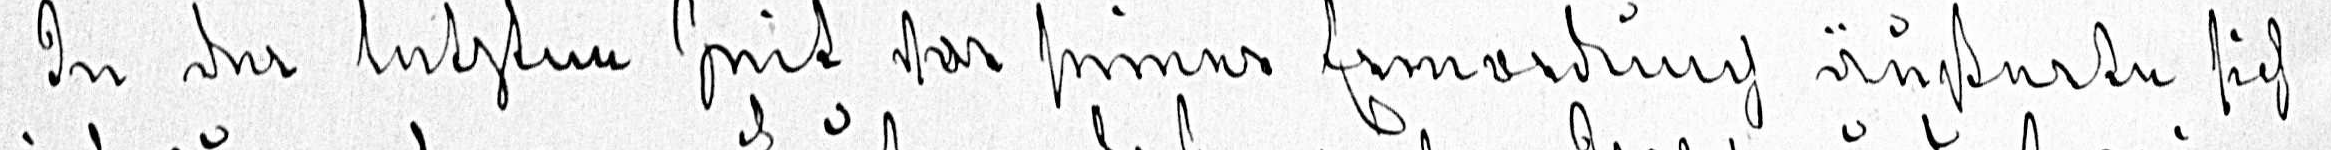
In der letzten Zeit vor seiner Ermordung äußerte sich
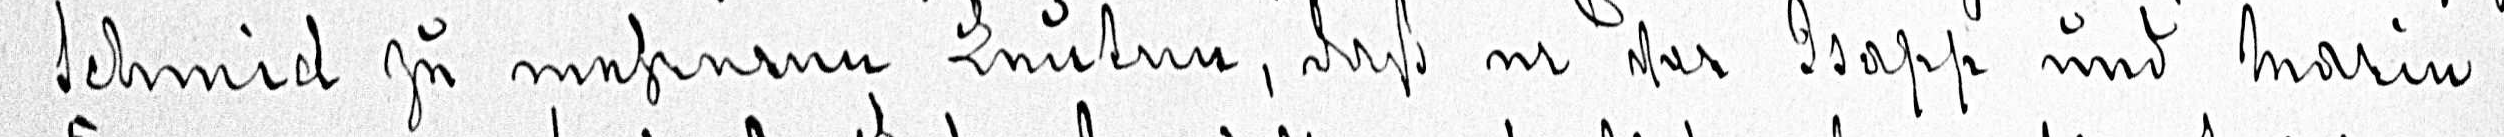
Schmid zu mehreren Leuten, daß er vor Isopp und Marie
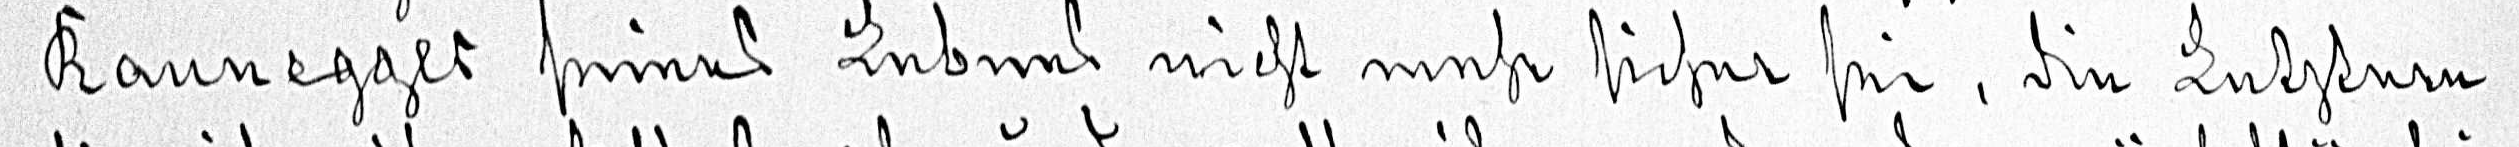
Raunegger seines Lebens nicht mehr sicher sei, die Letztere
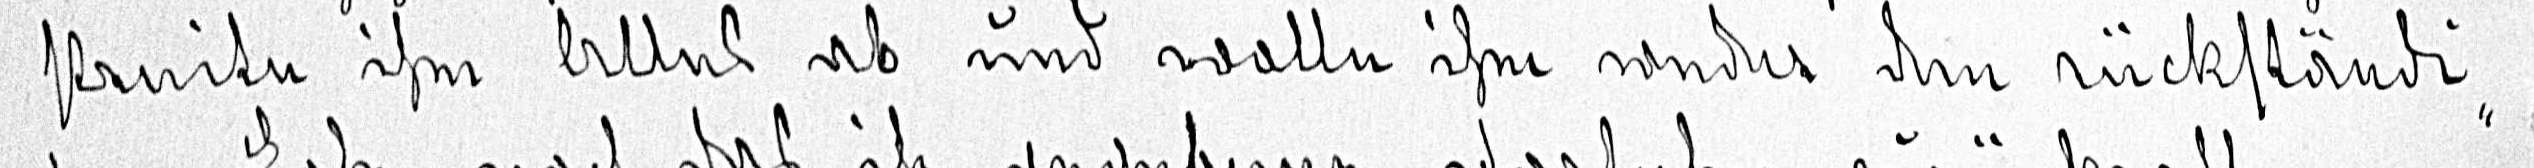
streite ihm Alles ab und wolle ihm weder den rückständi¬
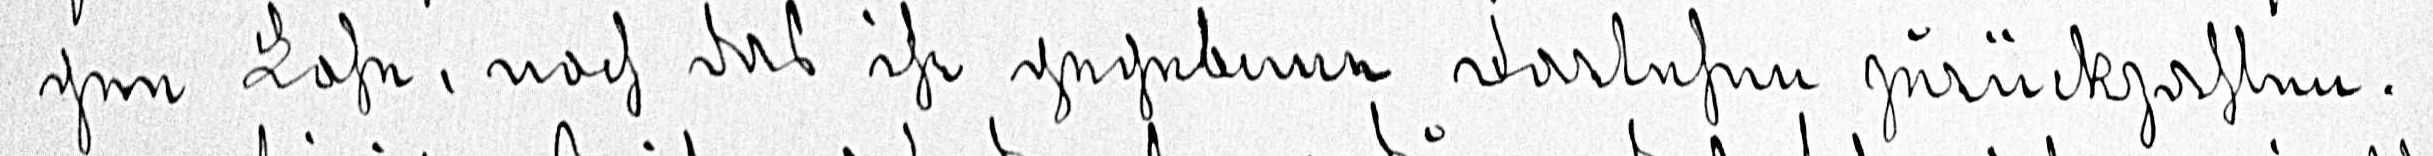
gen Lohn, noch das ihr gegebene Darlehen zurückzahlen.
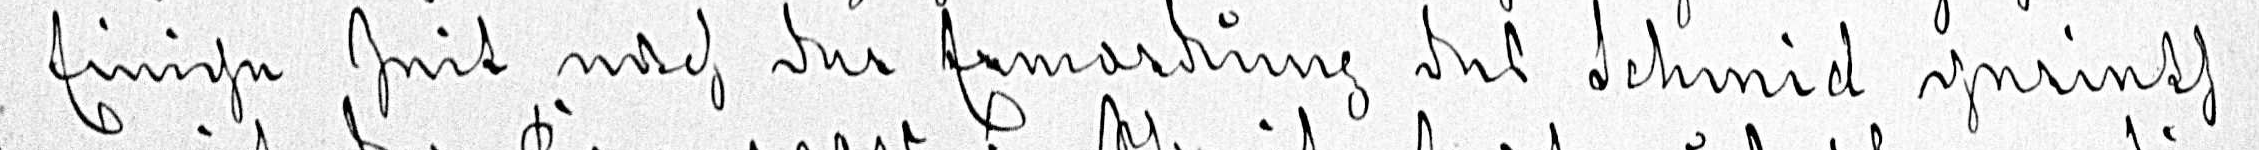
Einige Zeit nach der Ermordung des Schmid gerieth
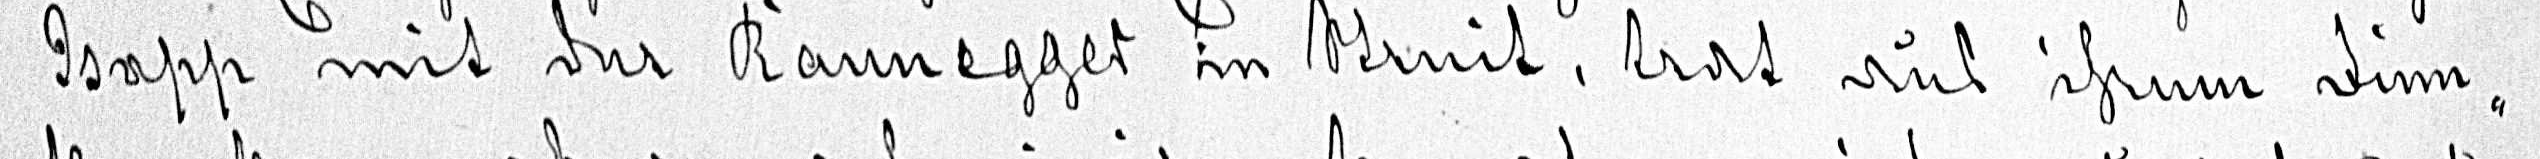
Isopp mit der Raunegger in Streit, trat aus ihrem Dien¬
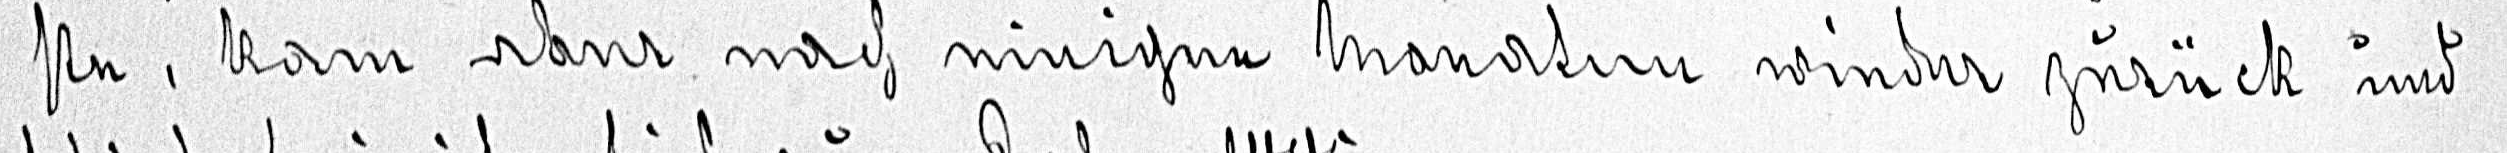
ste, kam aber nach einigen Monaten wieder zurück und
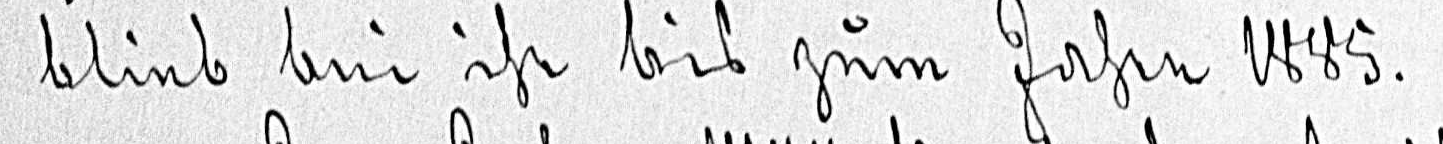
blieb bei ihr bis zum Jahre 1885.
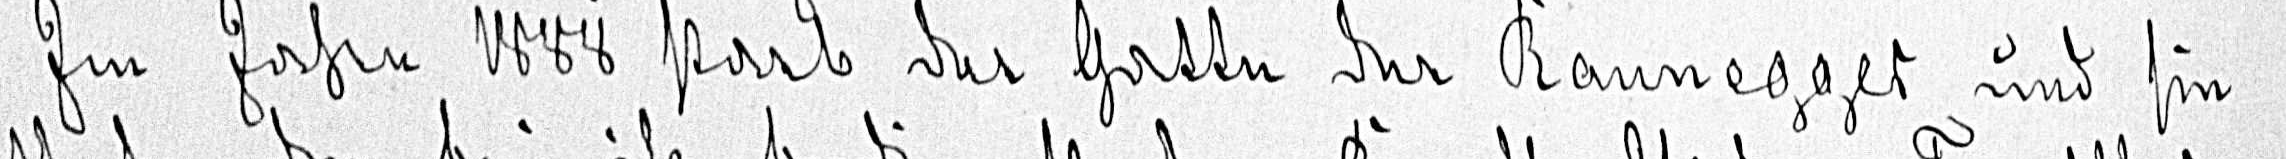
Im Jahre 1888 starb der Gatte der Raunegger und sie
